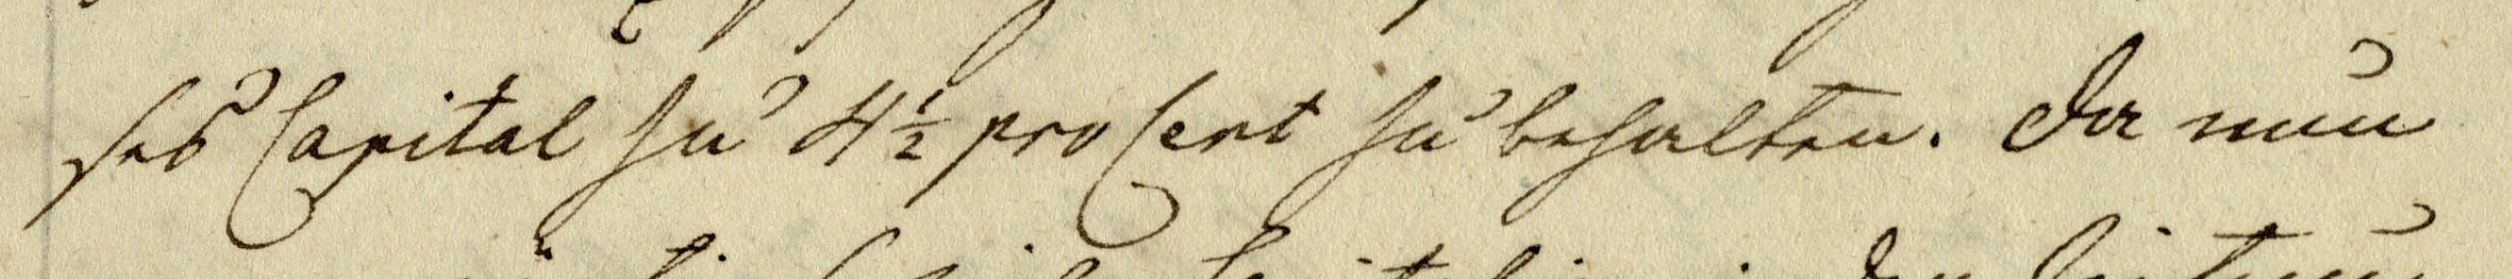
ses Capital zu 4 ½ pro Cent zu behalten. Da nun
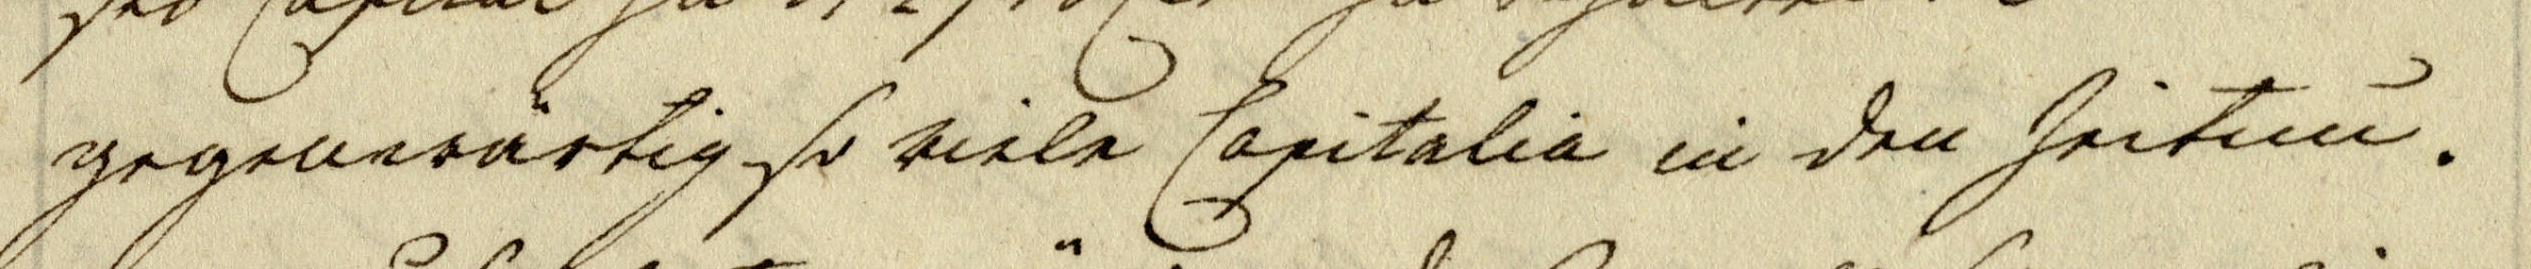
gegenwärtig so viele Capitalia in den Zeitun¬
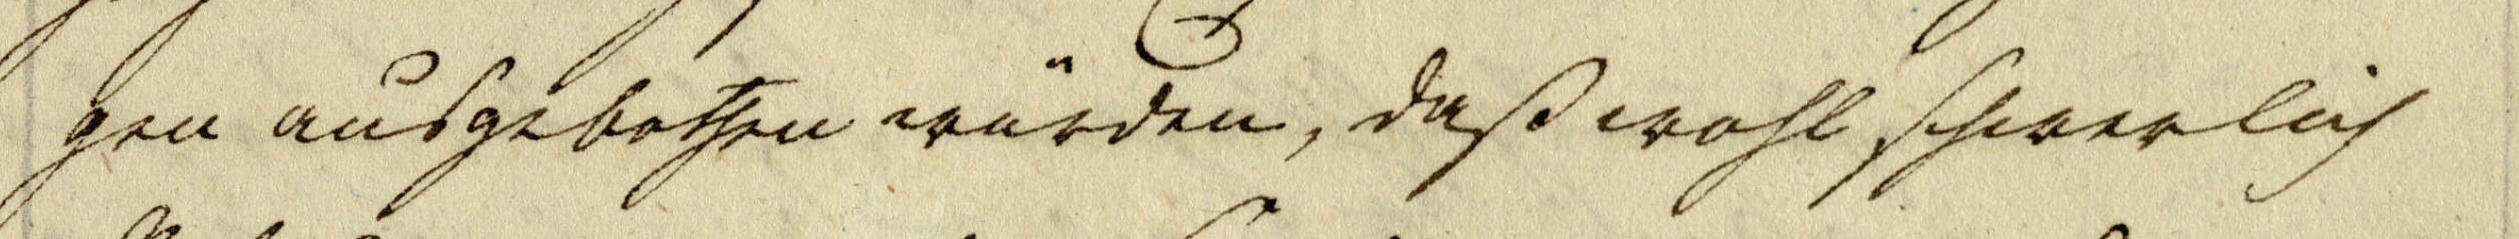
gen ausgebothen würden, daß wohl schwerlich
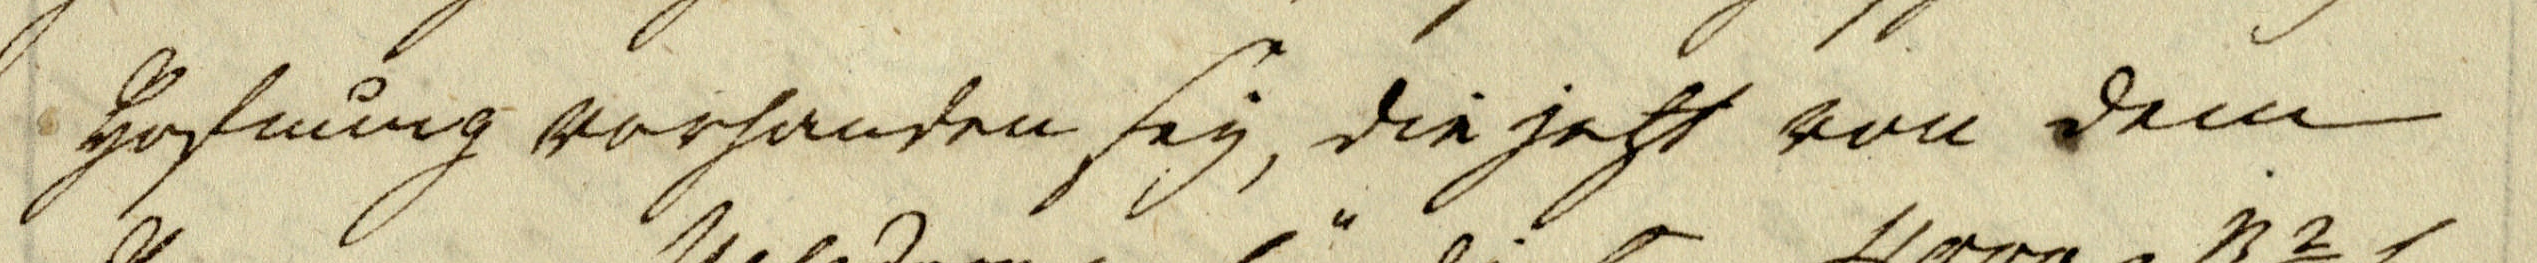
Hofnung vorhanden seÿ, die jetzt von dem
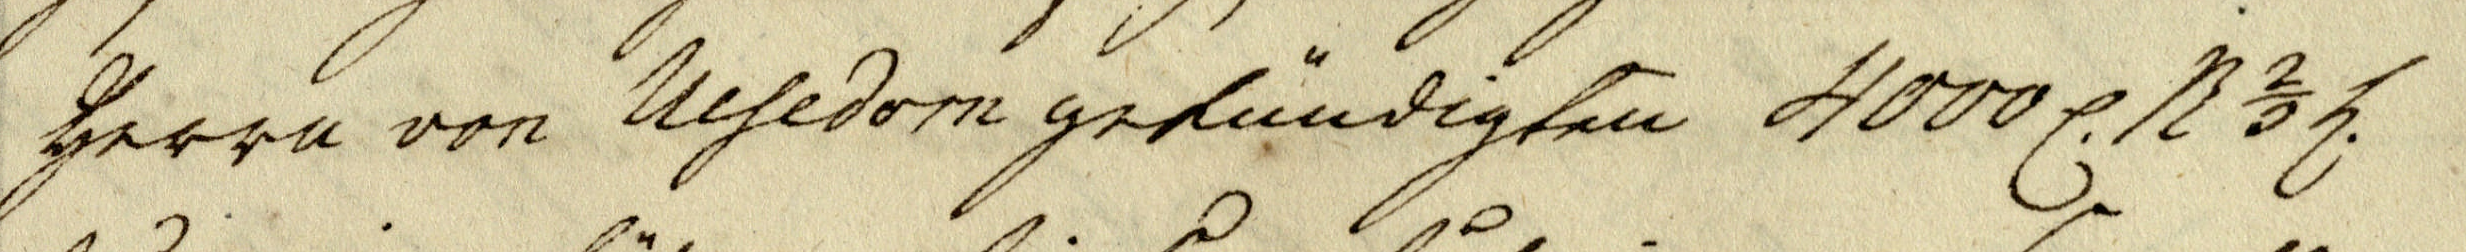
Herrn von Uesedom gekündigten 4000 l. N ¾ h.
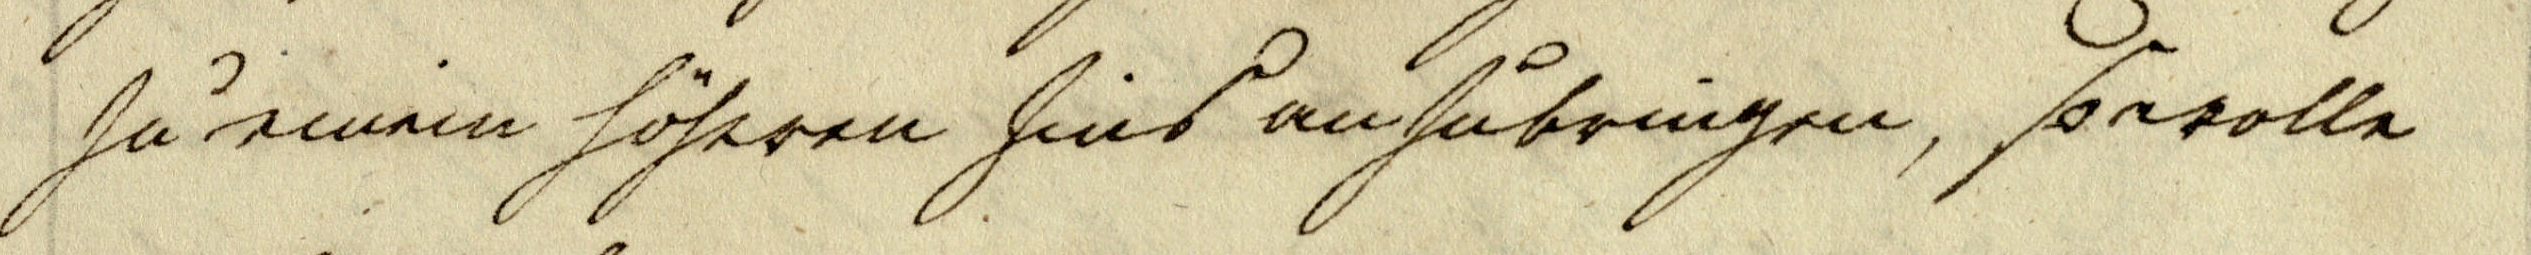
zu einem höheren Zins anzubringen, so wolle
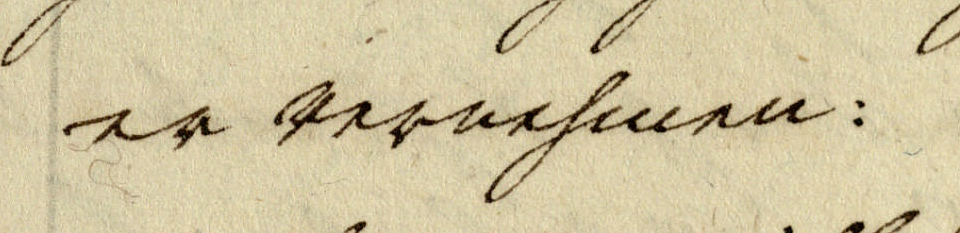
er vernehmen:
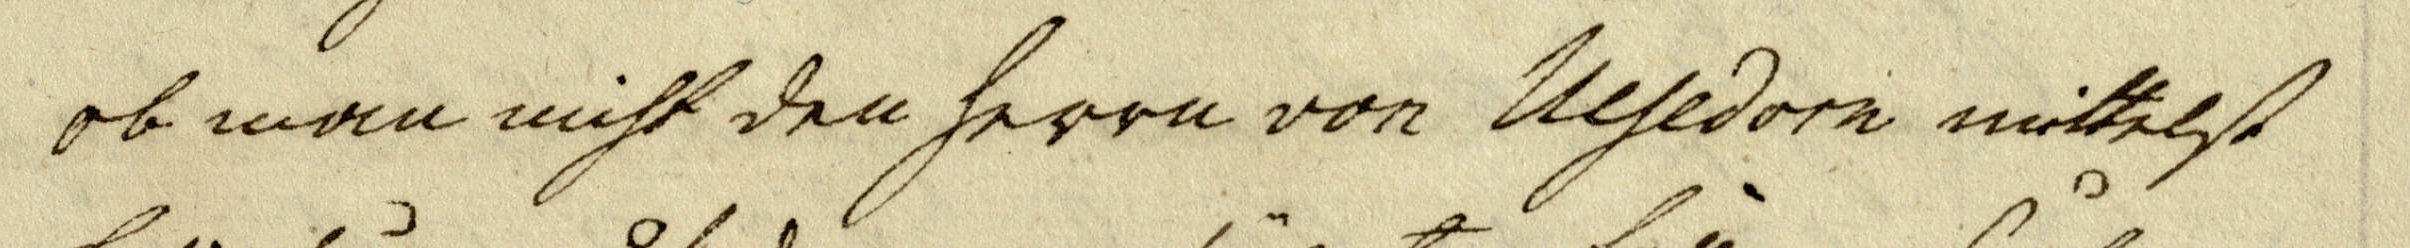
ob man nicht den Herrn von Uesedom mittelst
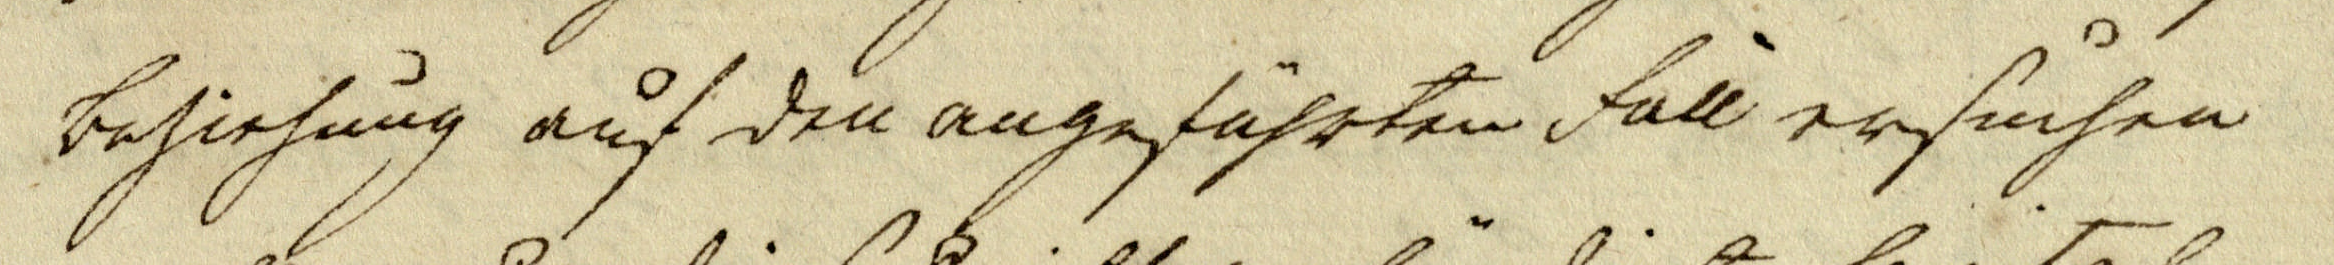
Beziehung auf den angeführten Fall ersuchen
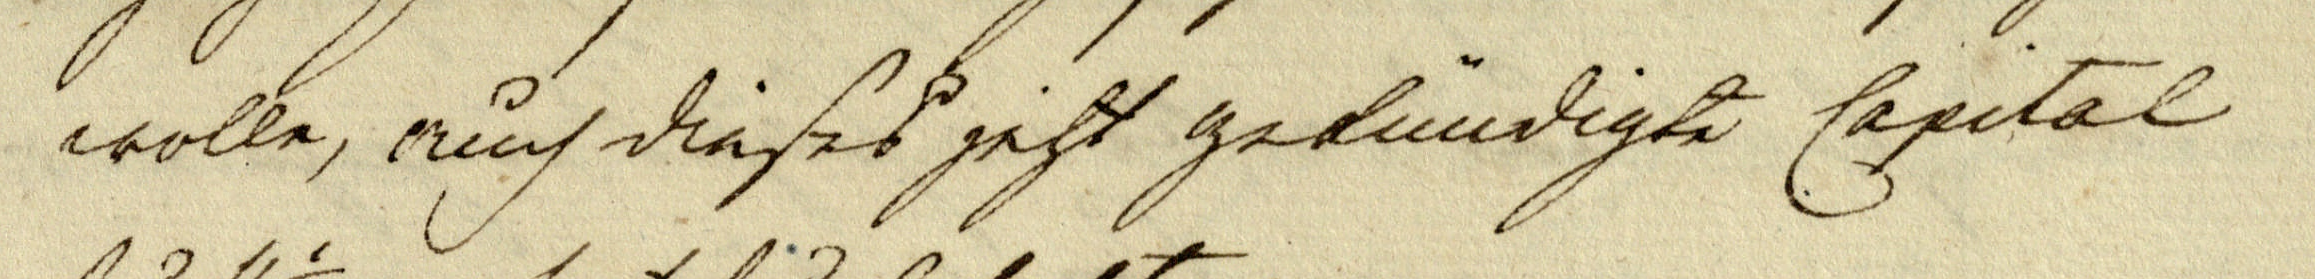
wolle, auch dieses jetzt gekündigte Capital
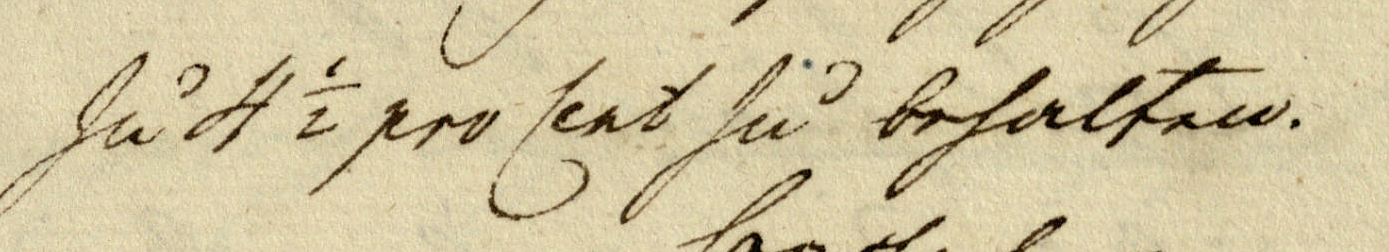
zu 4½ pro Cent zu behalten.
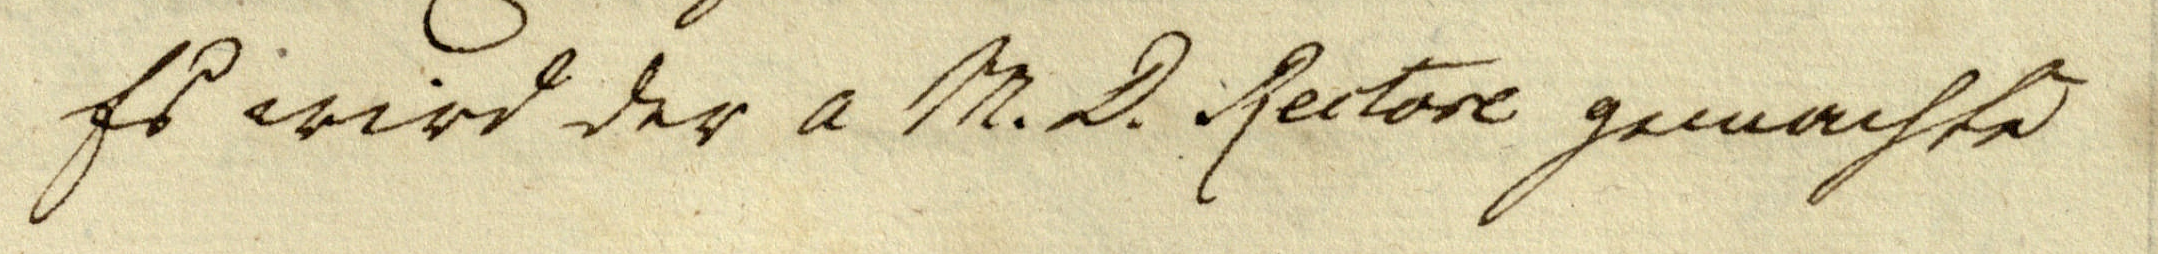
Es wird der a M. D. Rectore gemachte
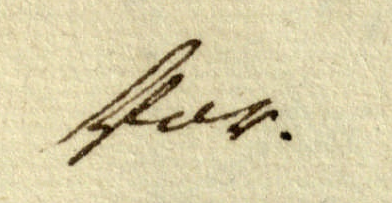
Vor¬
